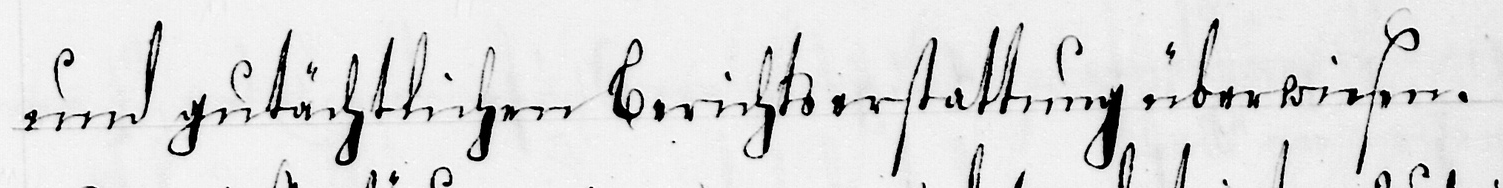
und gutächtlichen Berichtserstattung überwiesen.
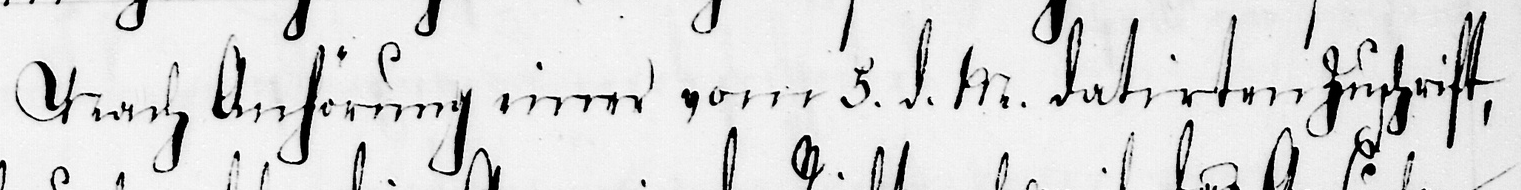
Nach Anhörung einer vom 5. d. M. datirten Zuschrift,
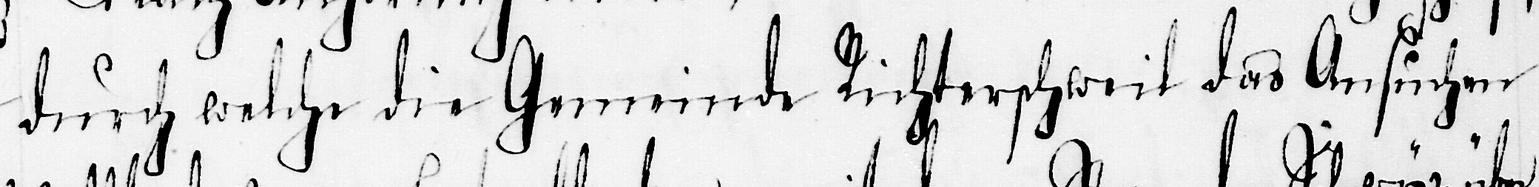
durch welche die Gemeinde Richterschweil das Ansuchen
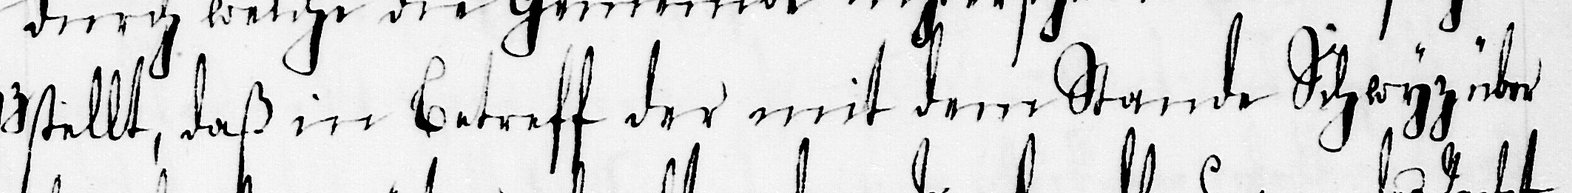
stellt, daß in Betreff der mit dem Stande Schwyz über
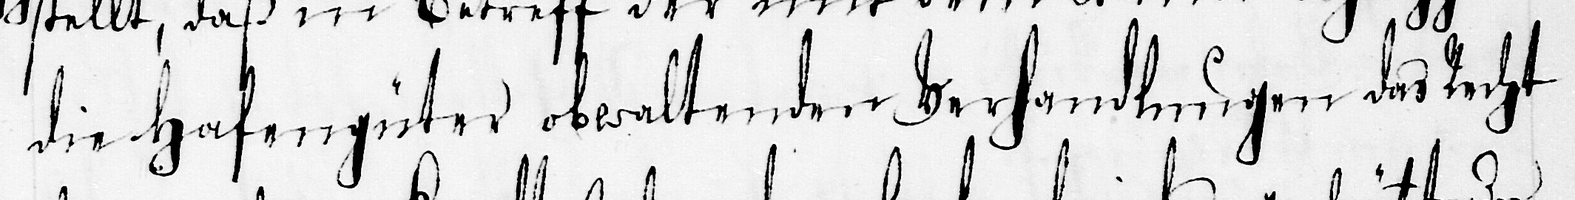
die Hafengüter obwaltenden Verhandlungen das Recht
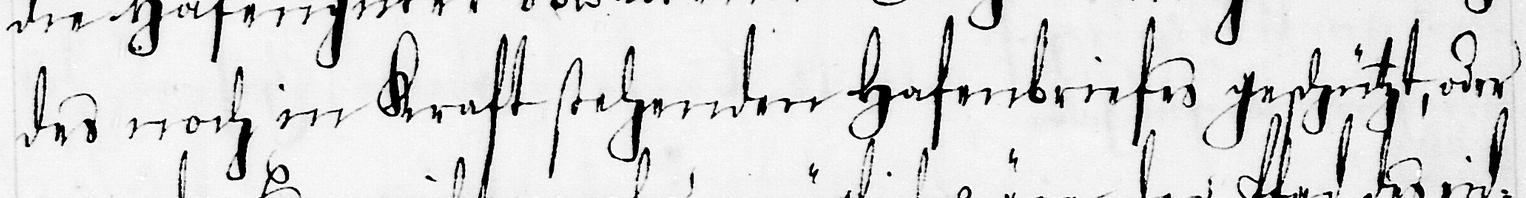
des noch in Kraft stehenden Hafenbriefes geschützt,
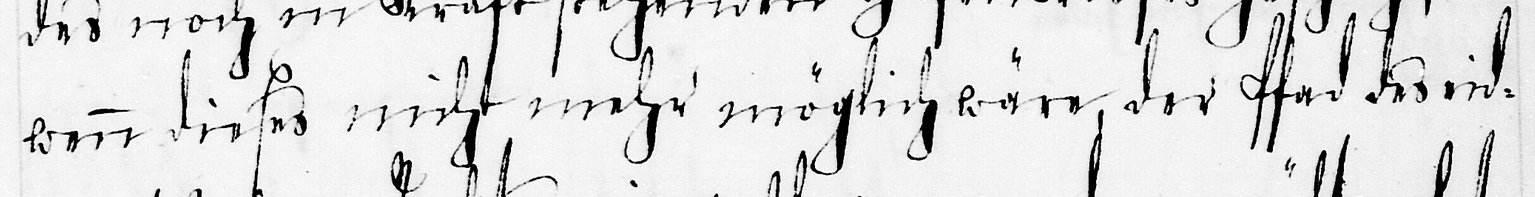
wenn dieses nicht mehr möglich wäre, der Pfad des eid¬
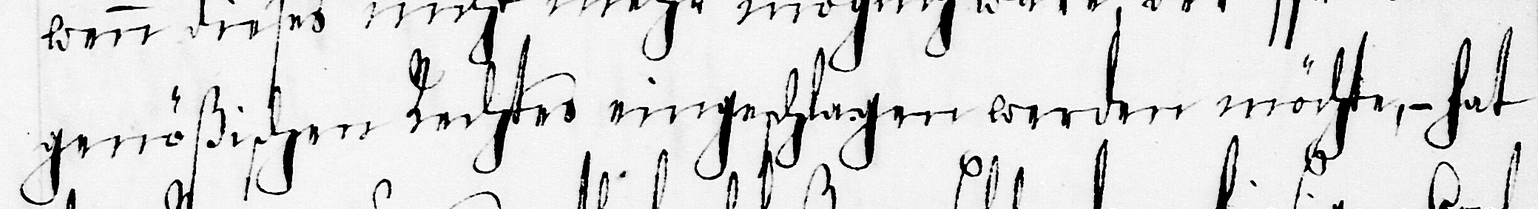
genößischen Rechtes eingeschlagen werden möchte, – hat
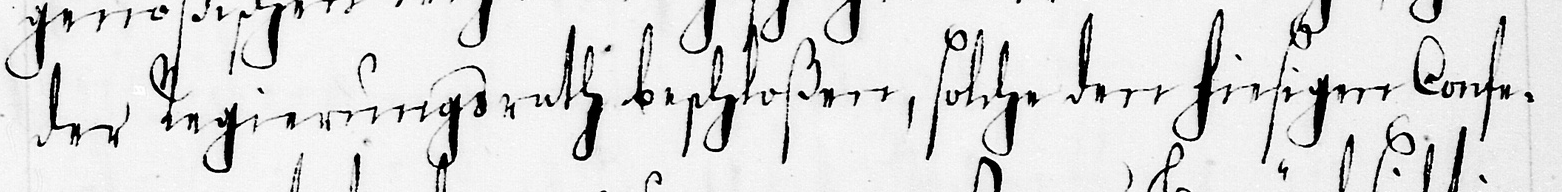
der Regierungsrath beschloßen, solche den hiesigen Confe¬
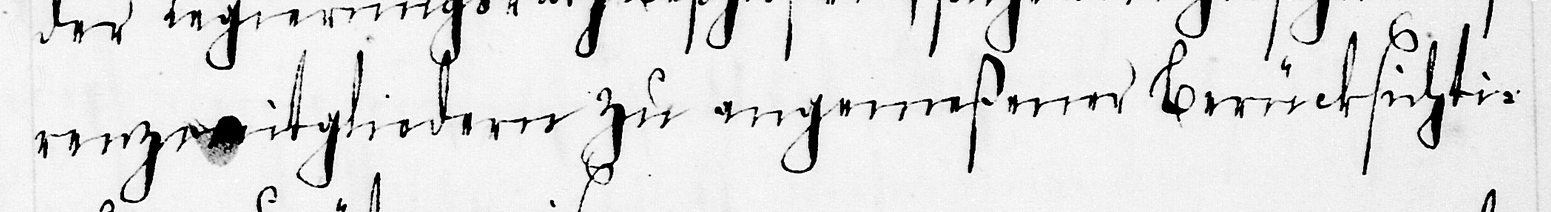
renzmitgliedern zu angemeßener Berücksichti¬
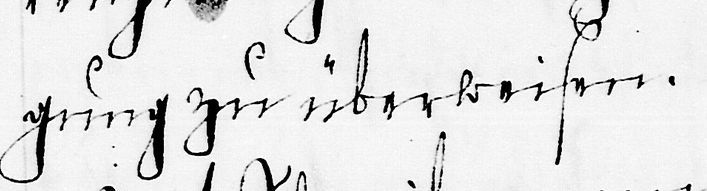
gung zu überweisen.
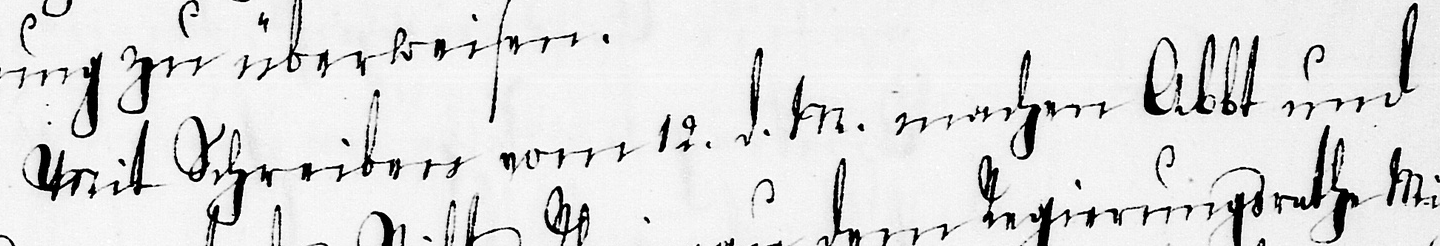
Mit Schreiben vom 12. d. M. machen Abbt und
